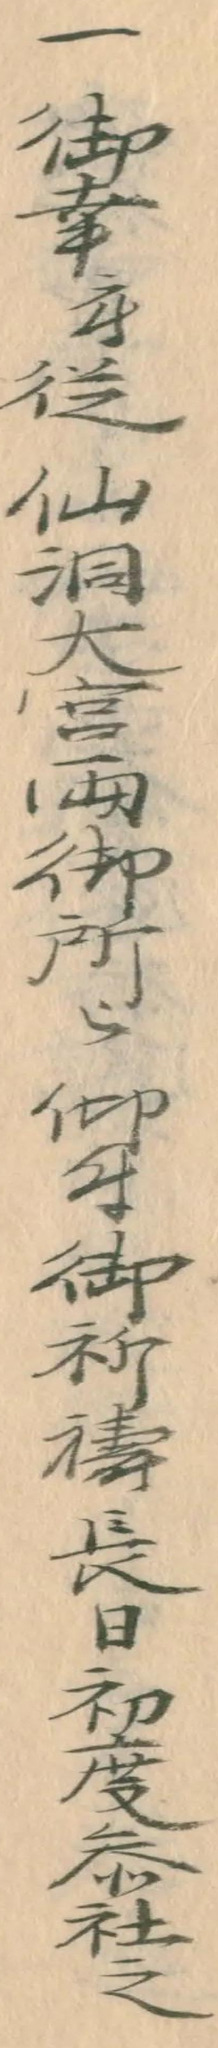一御幸ニ付従仙洞大宮両御所被仰付御祈祷長日初度参社之
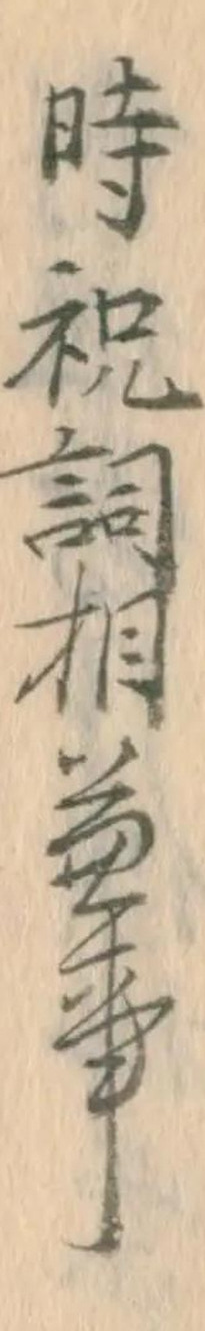時祝詞相兼事
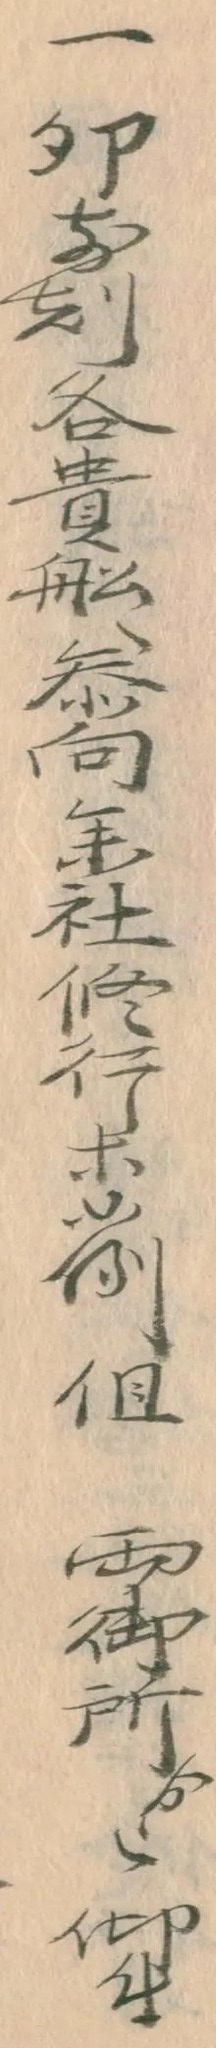一卯前刻各貴舩へ参向参社修行等如例但両御所ゟ被仰付
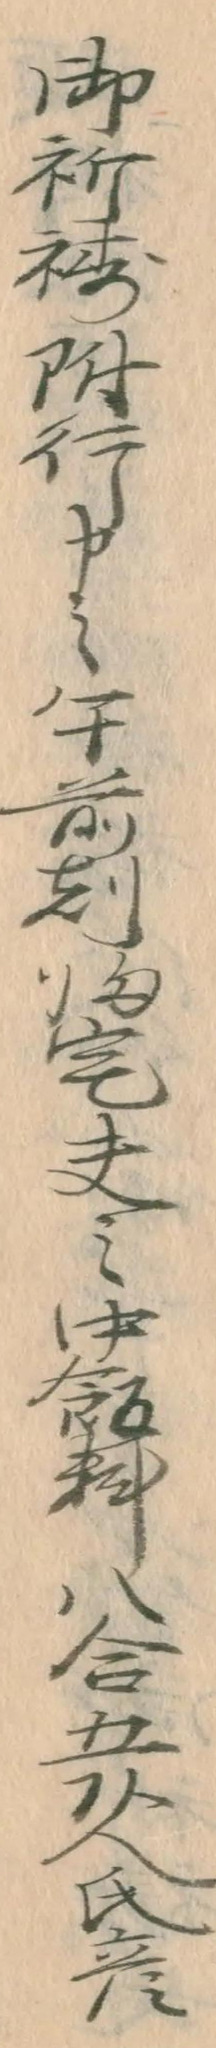御祈祷附行申之午前刻帰宅夫〻中飯料八合五頭人氏彦
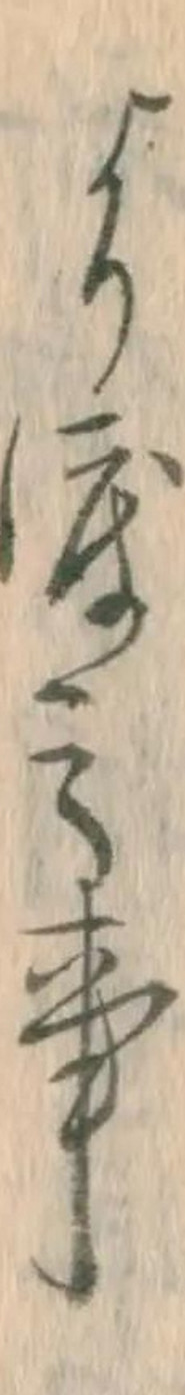より渡之事
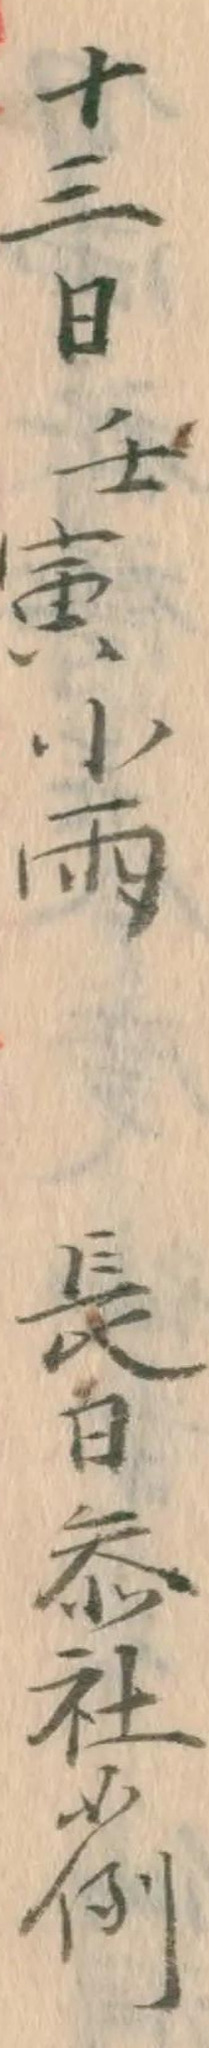十三日壬寅小雨長日参社如例
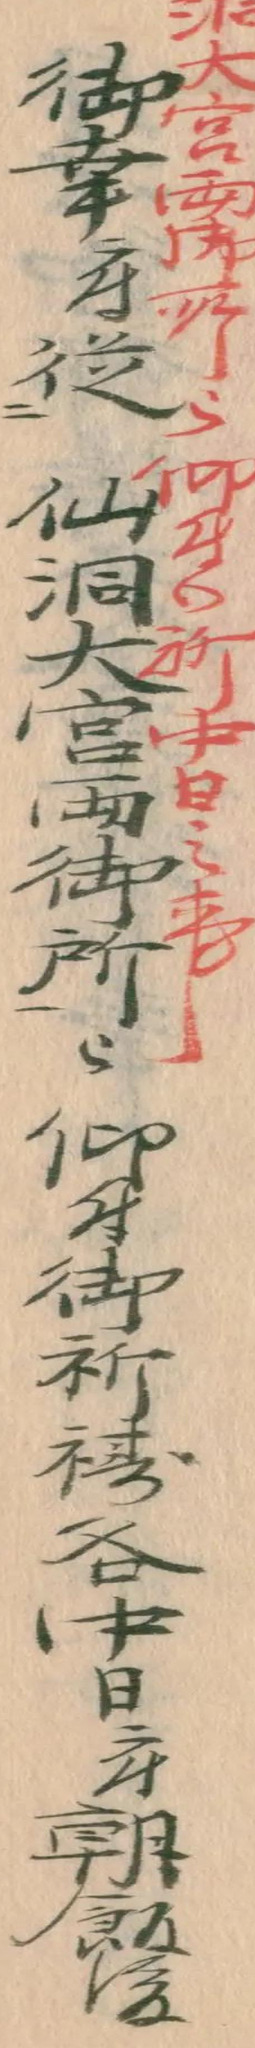一御幸ニ付従仙洞大宮両御所被仰付御祈祷各中日ニ付朝飯後
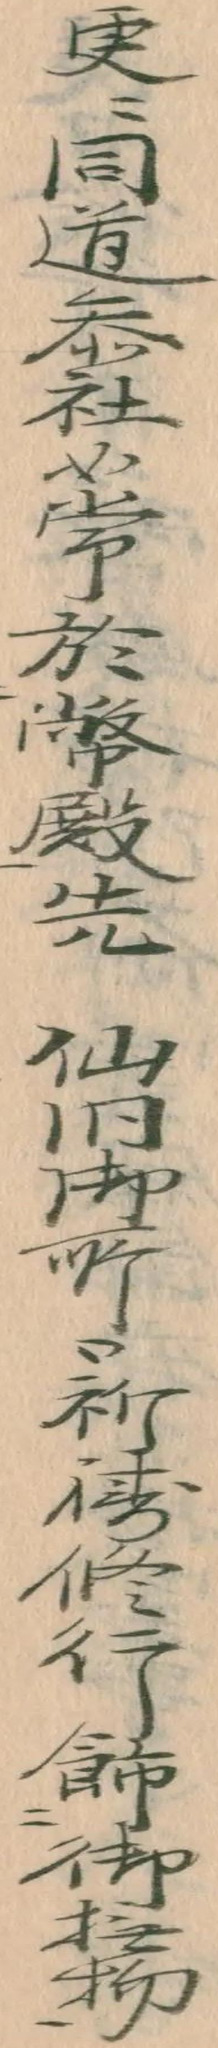更ニ同道参社如常於幣殿先仙洞御所御祈祷修行飾御撫物
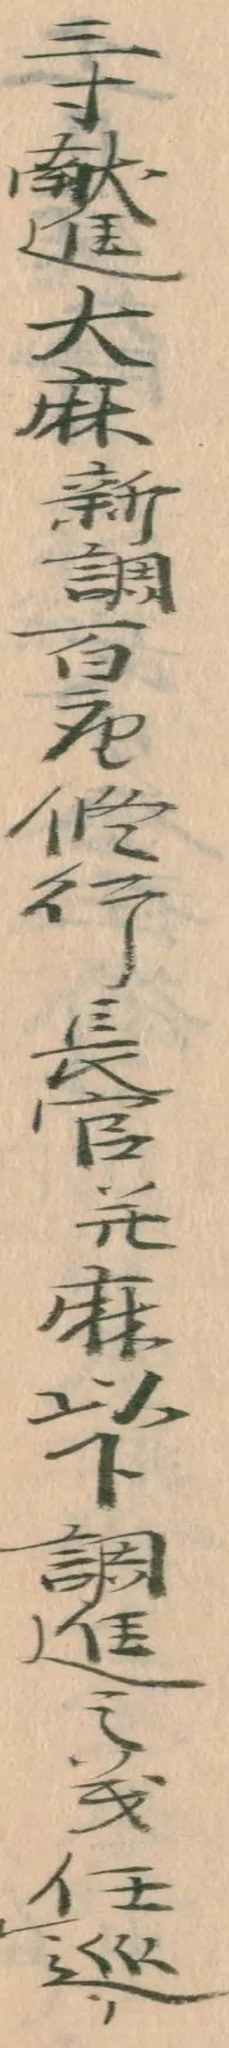三寸献進大麻新調百座修行長官并麻以下調進之義任巡
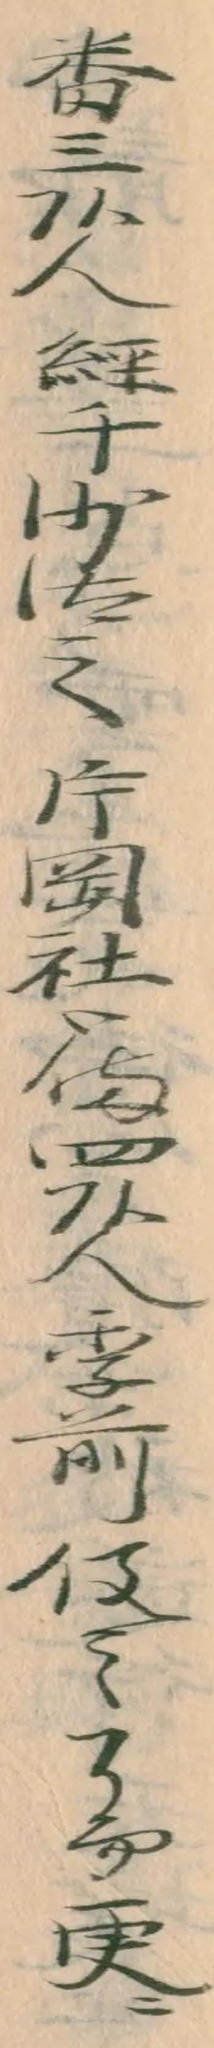番三頭人経千沙汰之片岡社御備四頭人季前役之了而更ニ
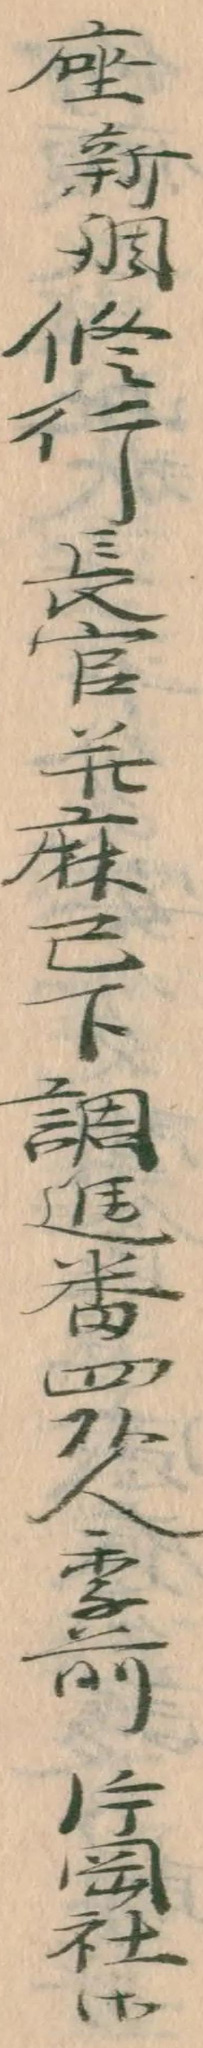座新調修行長官并麻已下調進番四頭人季前片岡社御
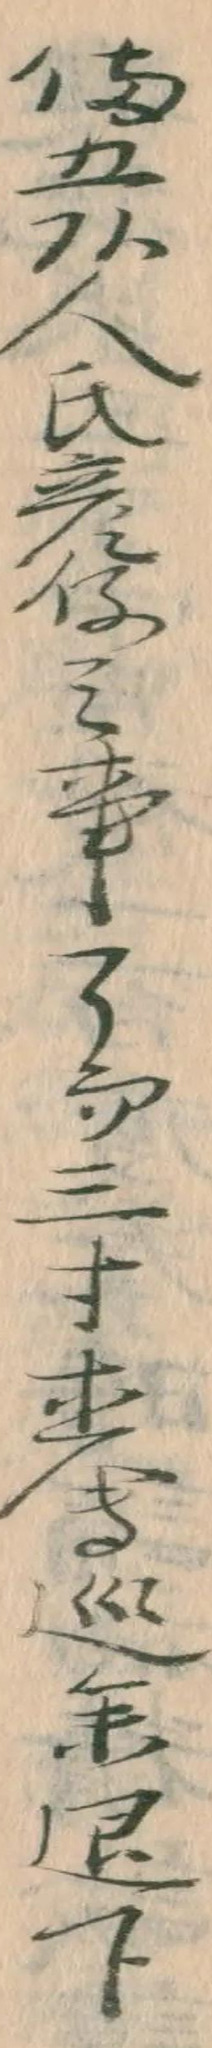備五頭人氏彦役之事了而三寸直會巡参退下
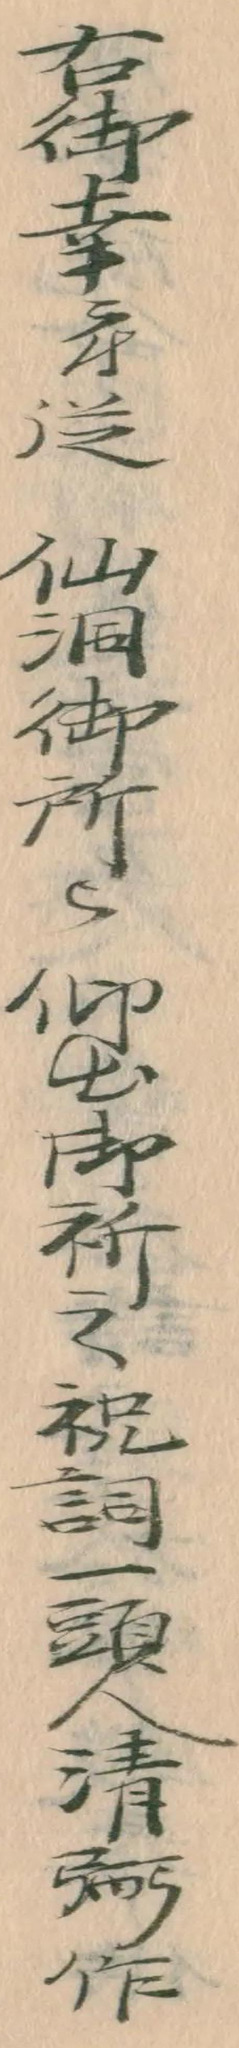右御幸ニ付従仙洞御所被仰出御祈之祝詞一頭人清弼作
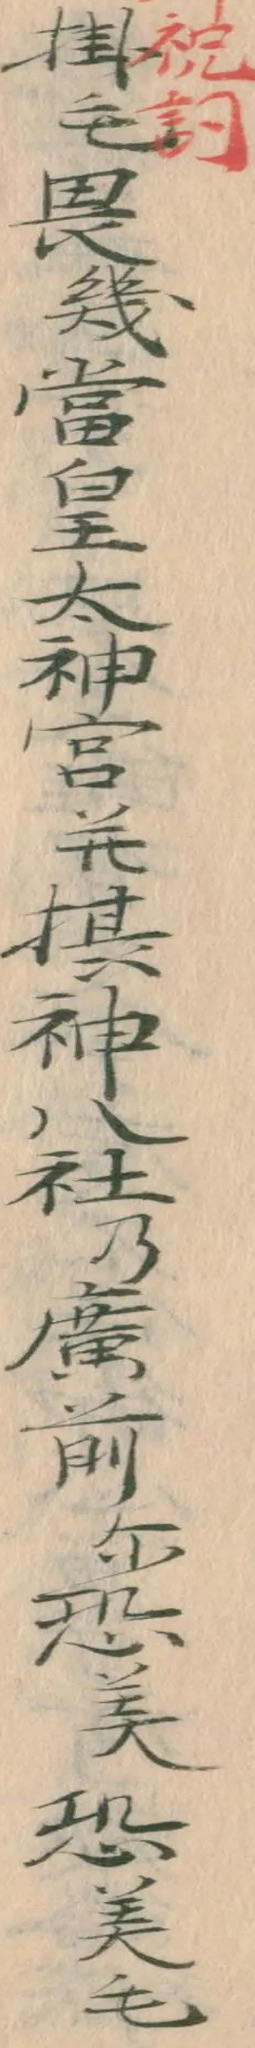掛毛畏幾當皇太神宮并摂神八社乃廣前尒恐美恐美毛
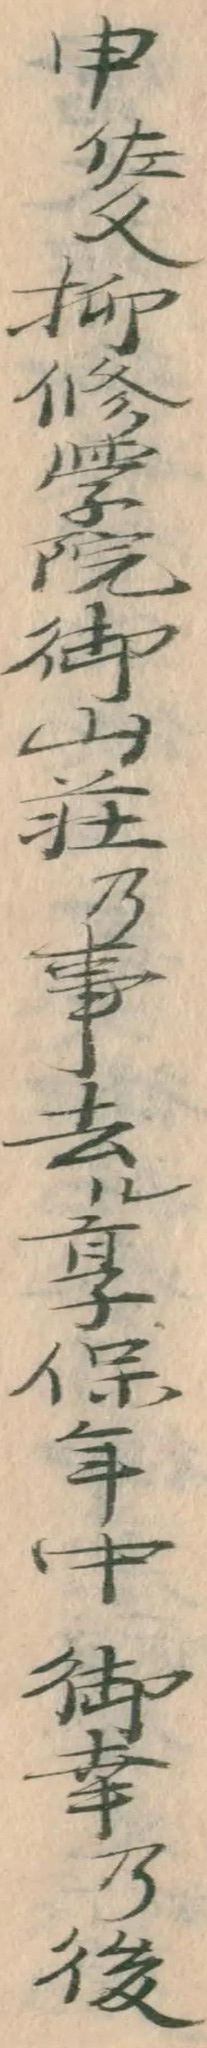申佐久抑修學院御山荘乃事去ル享保年中御幸乃後
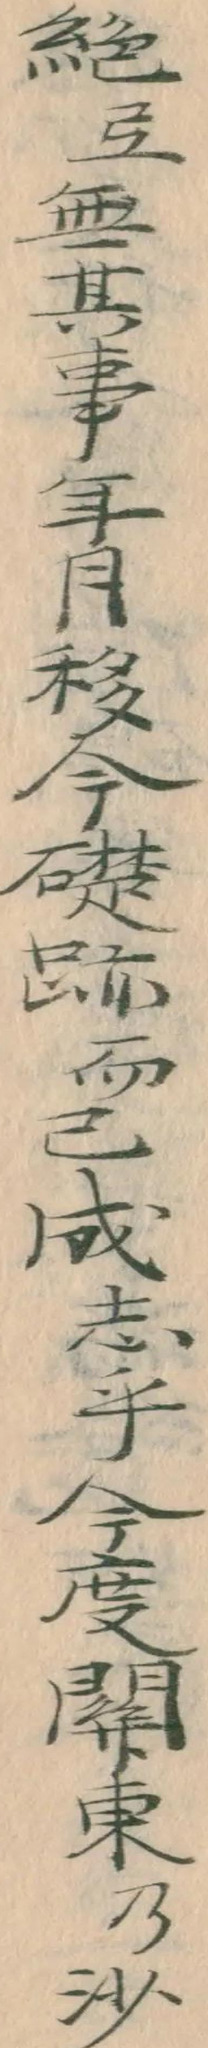絶弖無其事年月移今礎跡而己成志乎今度関東乃沙
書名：賀茂社記録. 第74冊
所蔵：国立国会図書館 National Diet Library, JAPAN
